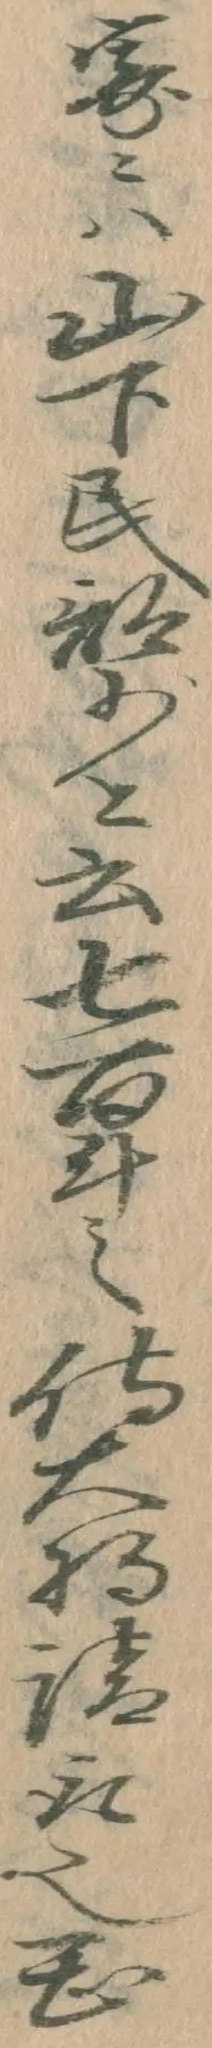寄には山下民部少と云七百計之侍大将請取之甚
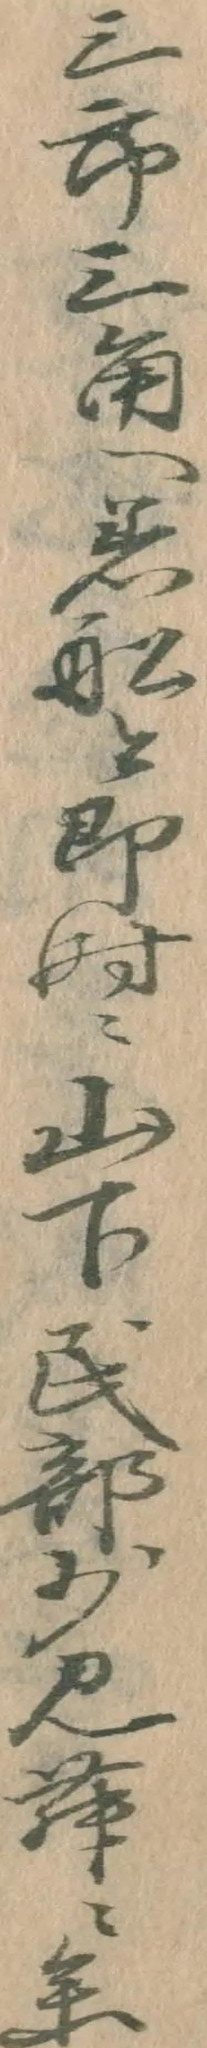三郎三角へ着船と即時に山下民部少見舞に参
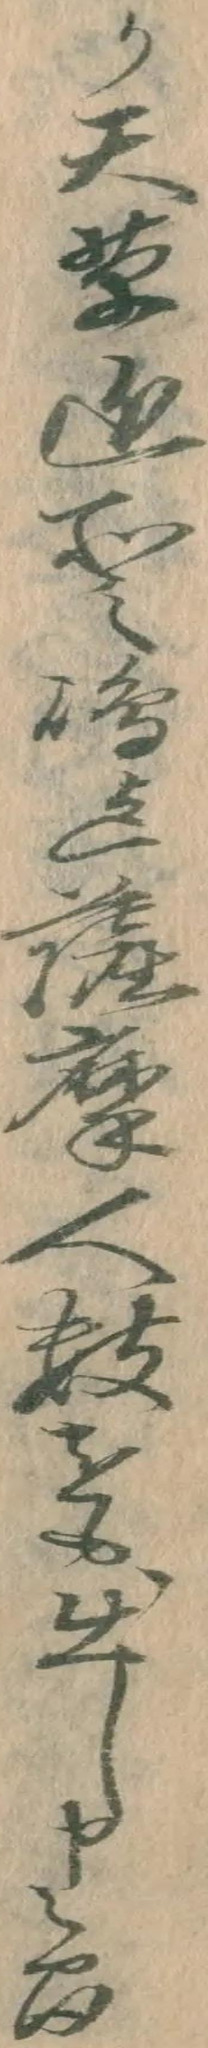り天草近所之島迄薩摩人数をも出し申之間
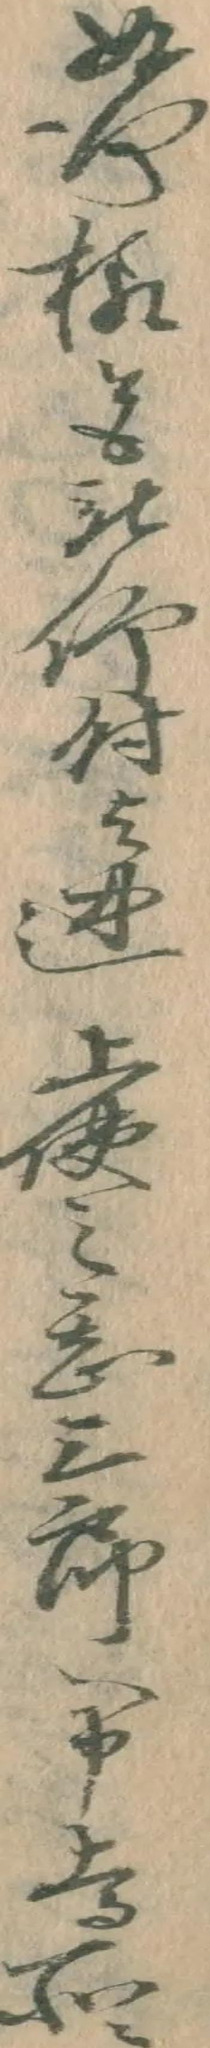如何様とも被仰付と迚上使之甚三郎へ申上る所に
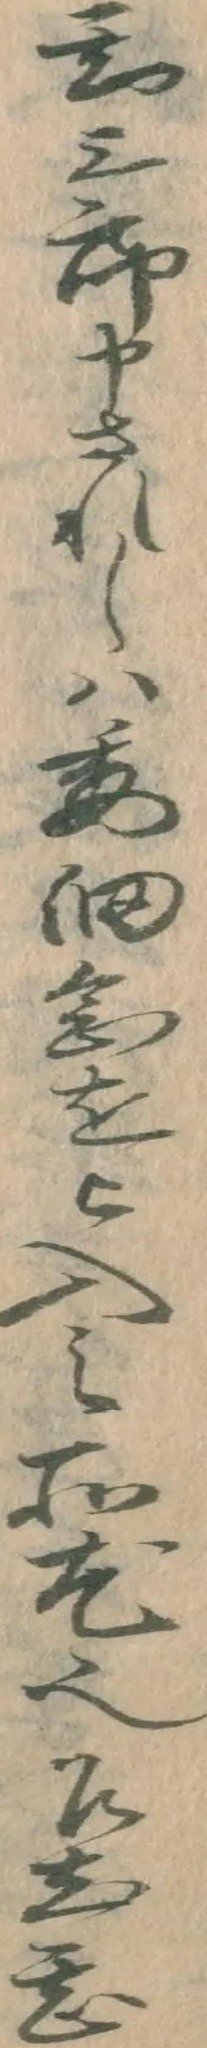甚三郎申されしは委細念を被入之所尤也乍去甚
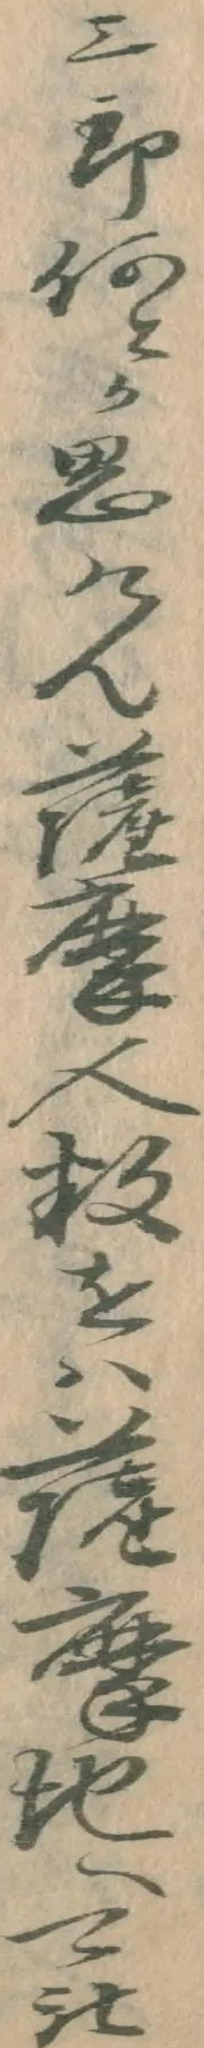三郎何とか思けん薩摩人数をは薩摩地へ可被
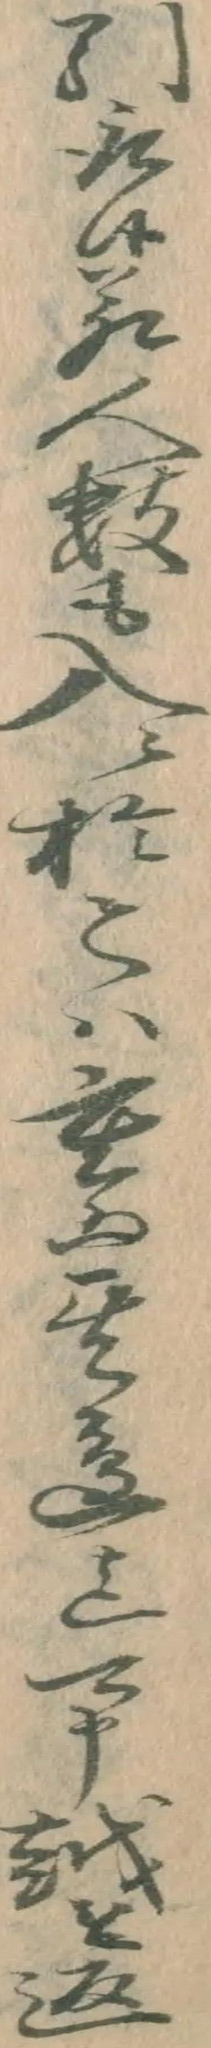引取候若人数も入に於ては重而其辺迄可申越と返

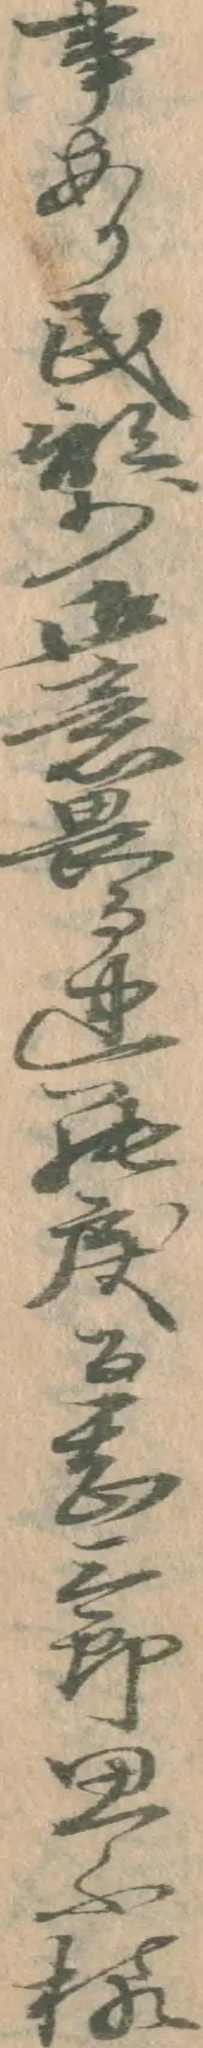事あり民部少御意畏る迚罷戻る甚三郎思ふ様
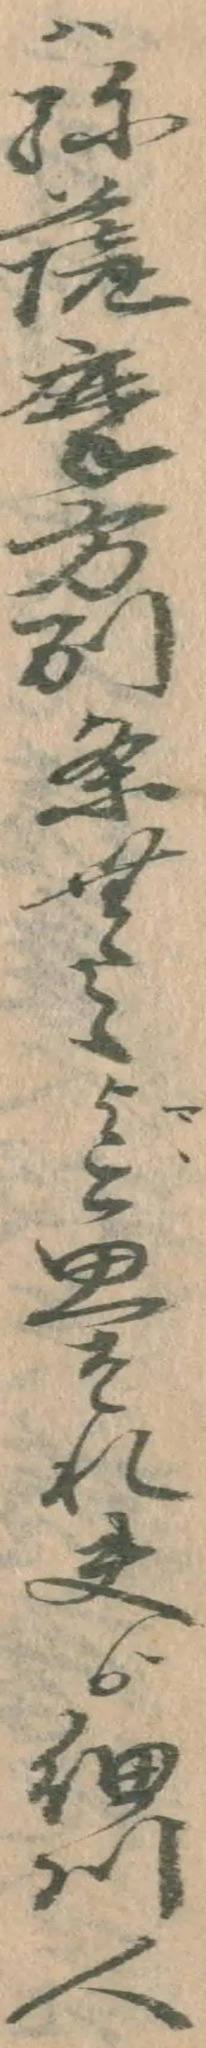は弥薩摩方別条無之とと思はれ夫ゟ細川人
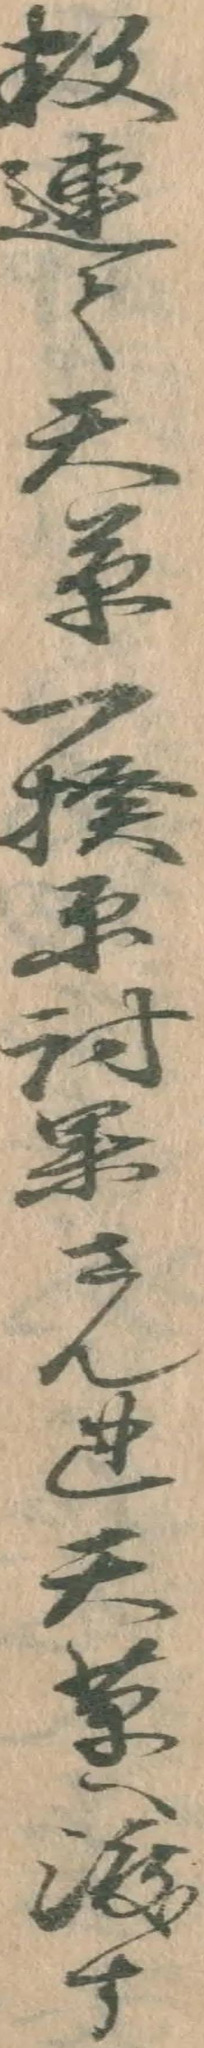数連て天草一揆原討果さん迚天草へ渡す
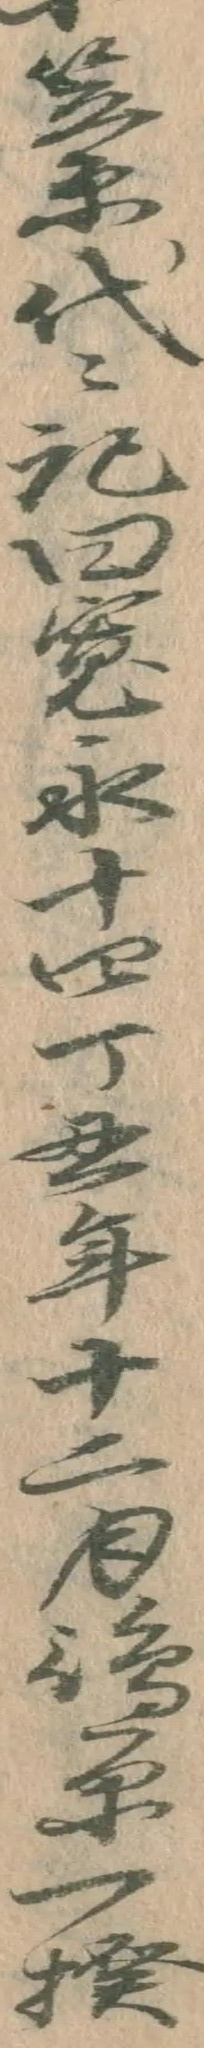小笠原代々記曰寛永十四年丁丑年十二月島原一揆
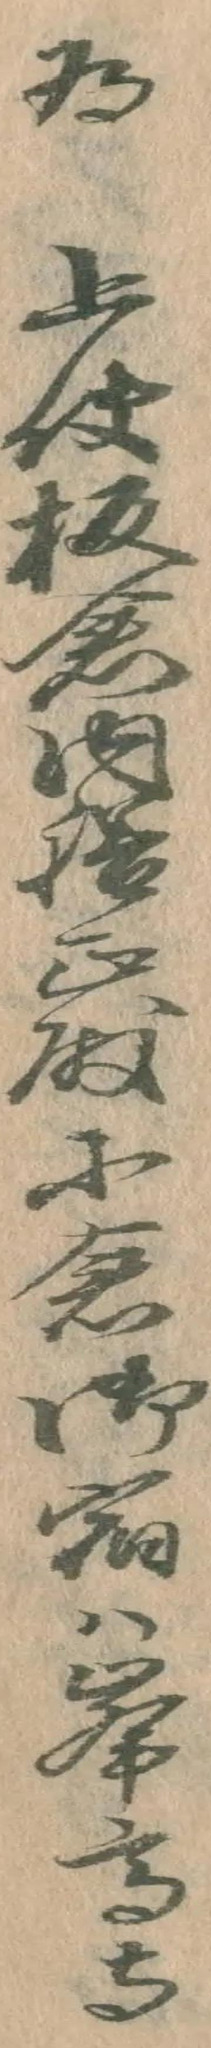為上使板倉内膳正殿小倉御宿は峯高寺
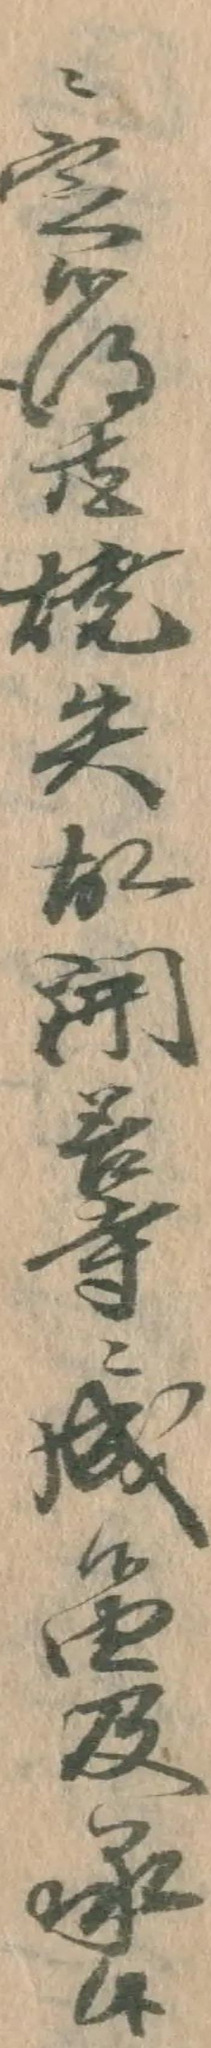に定候得共焼失故開善寺に成候由及承候
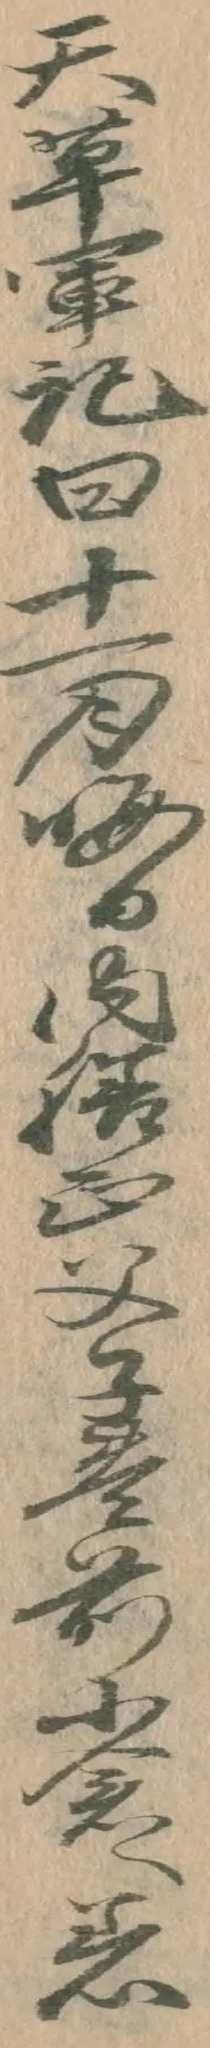天草軍記曰十一月晦日内膳正父子豊前小倉へ着
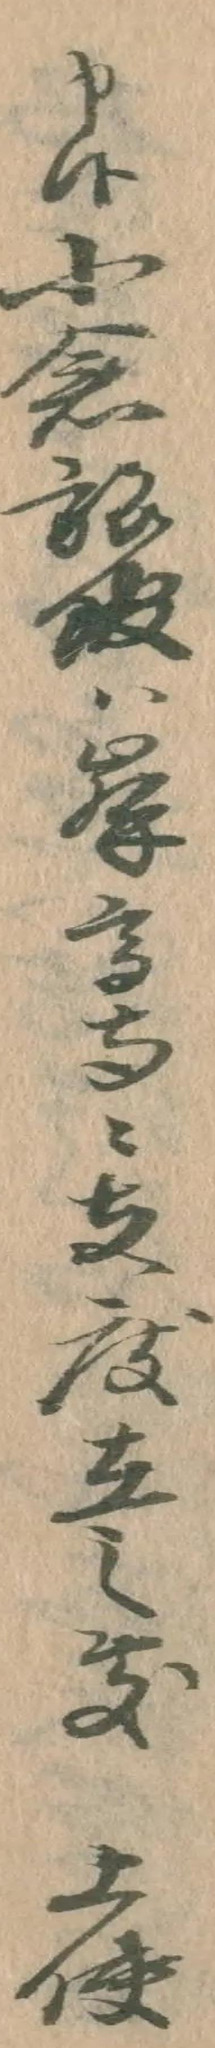申候小倉旅宿は峯高寺に支度在之処上使
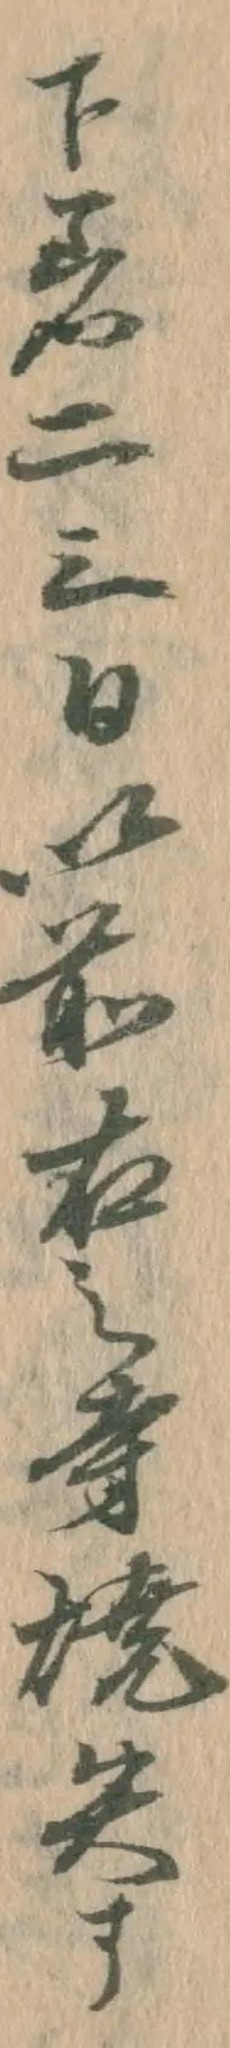下着二三日以前右之寺焼失す
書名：切支丹御退治記 49巻. [3]
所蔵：国立国会図書館 National Diet Library, JAPAN
